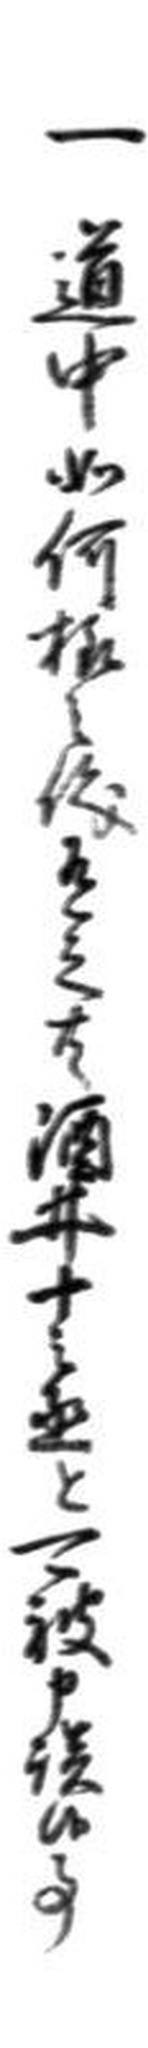一道中如何様之儀有之共酒井十之丞と可被申談候事
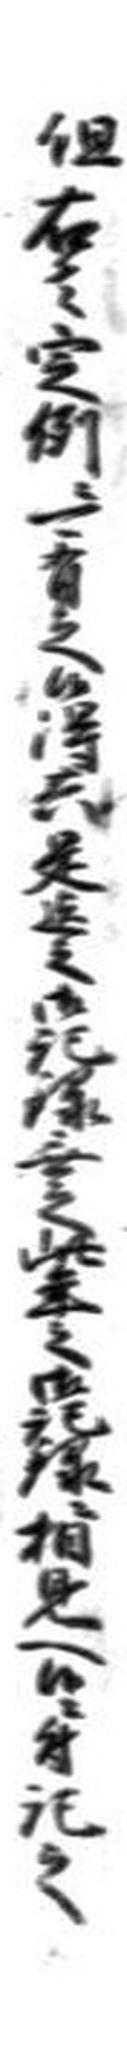但右者定例ニ可有之候得共是迄之御記録無之此年之御記録ニ相見ヘ候ニ付記之
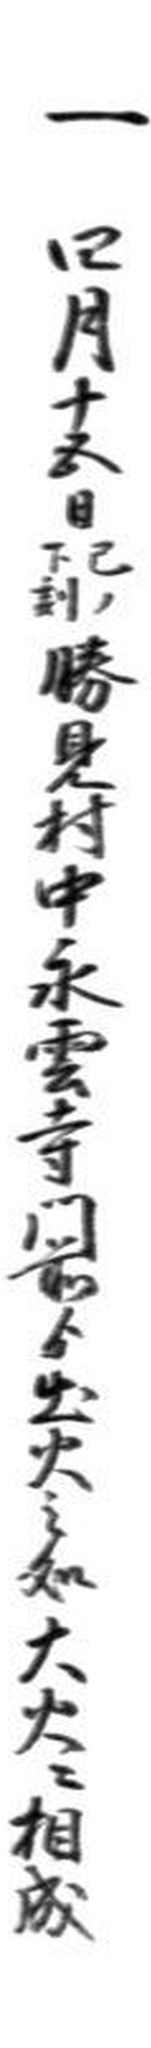一四月十五日巳ノ下刻勝見村中永雲寺門前ゟ出火之処大火ニ相成

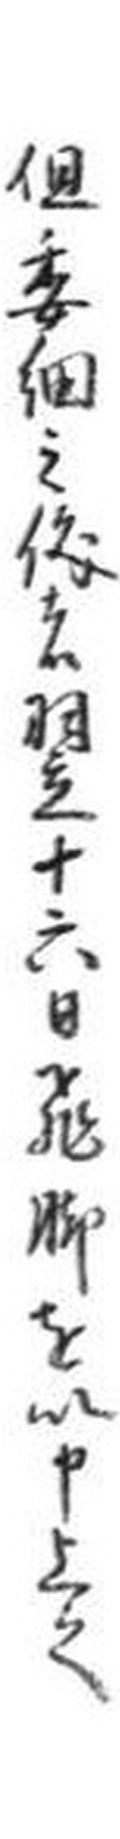但委細之儀者翌十六日飛脚を以申上之
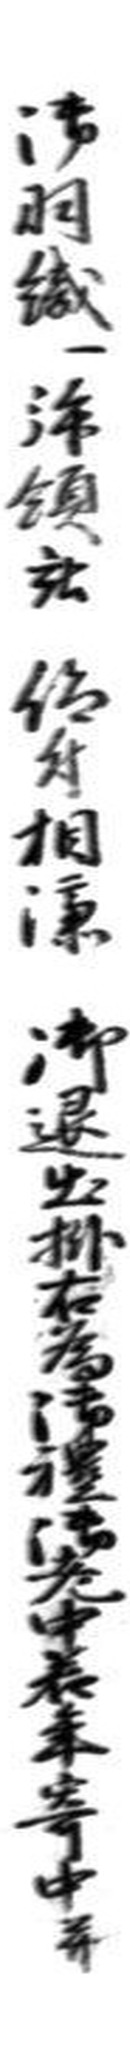御羽織一拝領被仰付相済御退出掛右為御礼御老中若年寄中幷
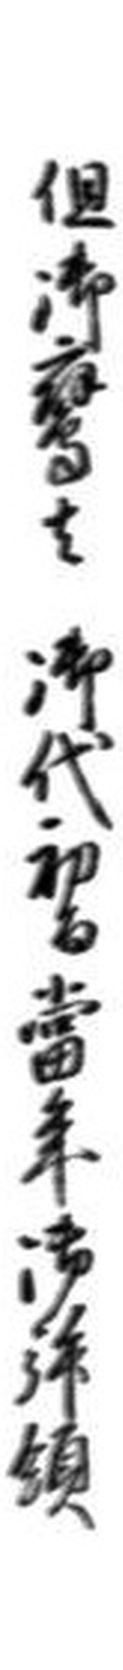但御鷹者御代初而当年御拝領
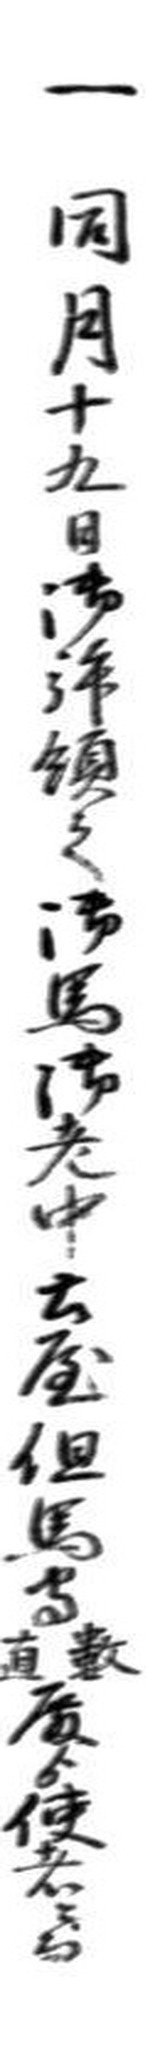一同月十九日御拝領之御馬御老中土屋但馬守数直殿ゟ使者ニ而
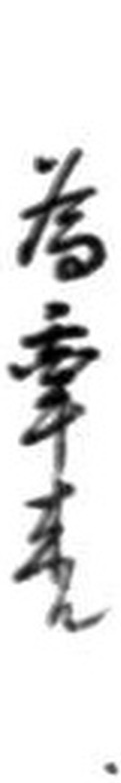為牽来ル
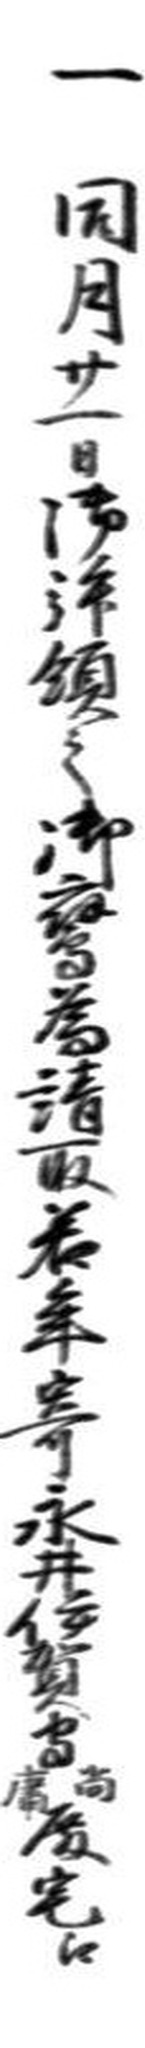一同月廿一日御拝領之御鷹為請取若年寄永井伊賀守尚庸殿宅江
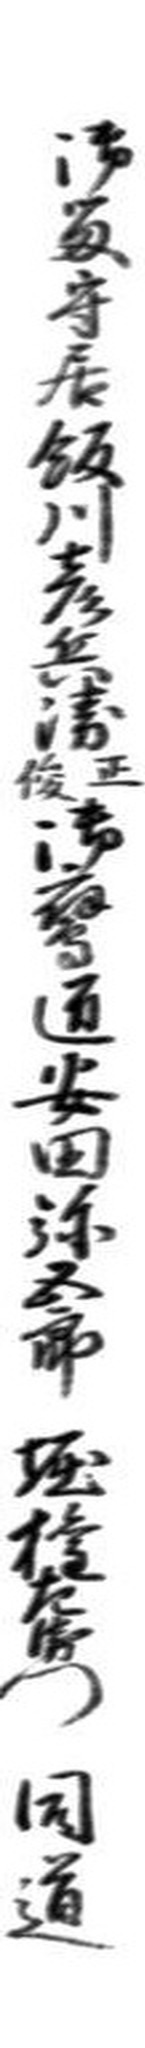御留守居飯川彦兵衛正俊御鷹匠安田弥五郎堀権左衛門同道
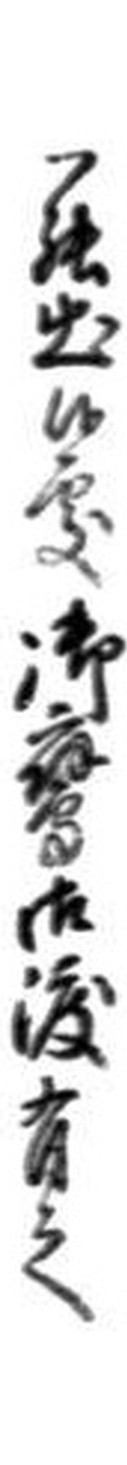罷出候処御鷹御渡有之
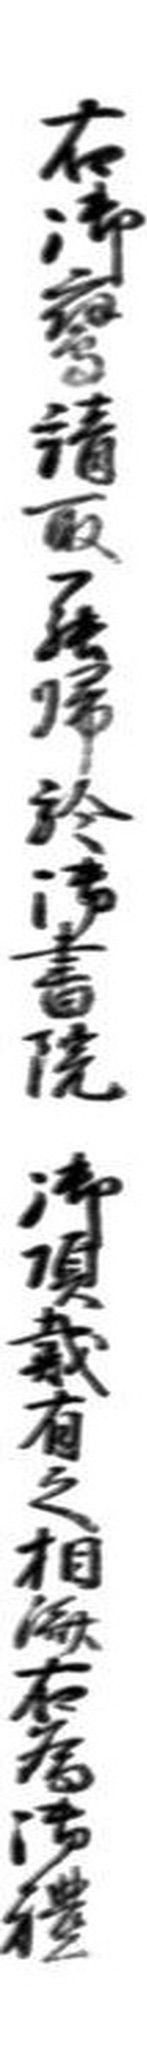右御鷹請取罷帰於御書院御頂戴有之相済右為御礼

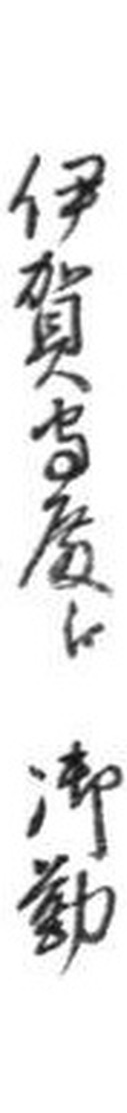伊賀守殿江御勤
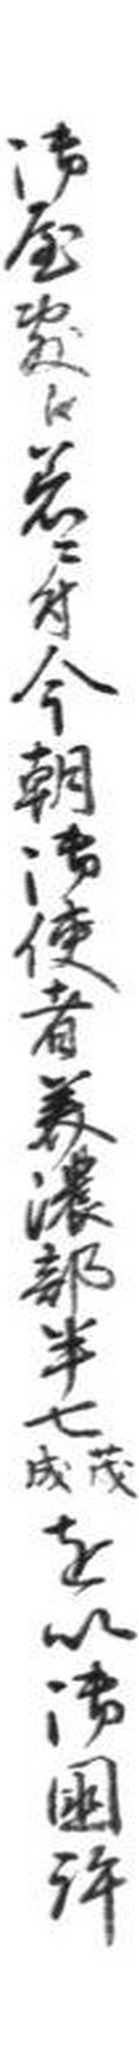御屋敷江着ニ付今朝御使者美濃部半七茂成を以御国許
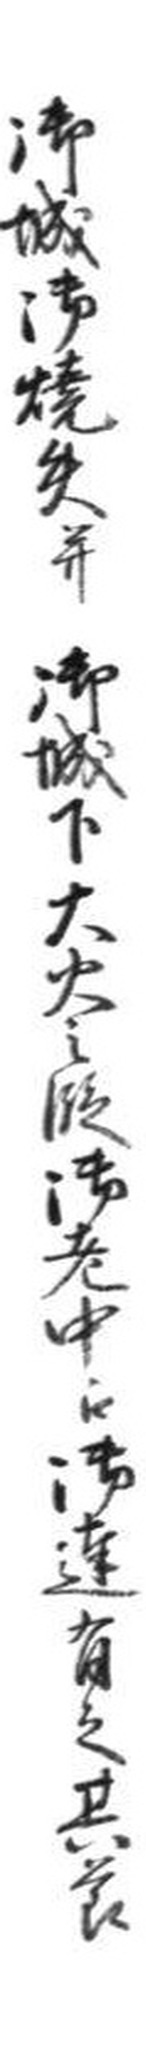御城御焼失并御城下大火之段御老中江御達有之其節
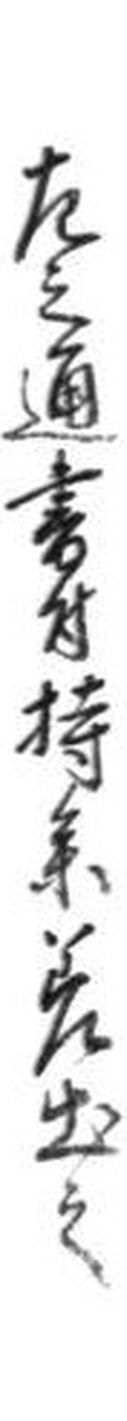左之通書付持参差出之
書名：家譜 七 光通公 従寛文四年到同九年
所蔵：福井県文書館 Fukui Prefectural Archives
